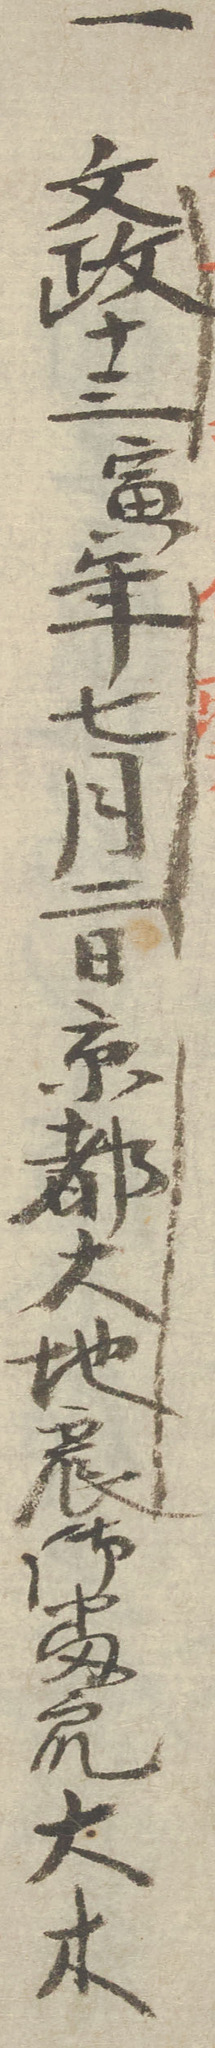一文政十三寅年七月二日京都大地震御番衆大木
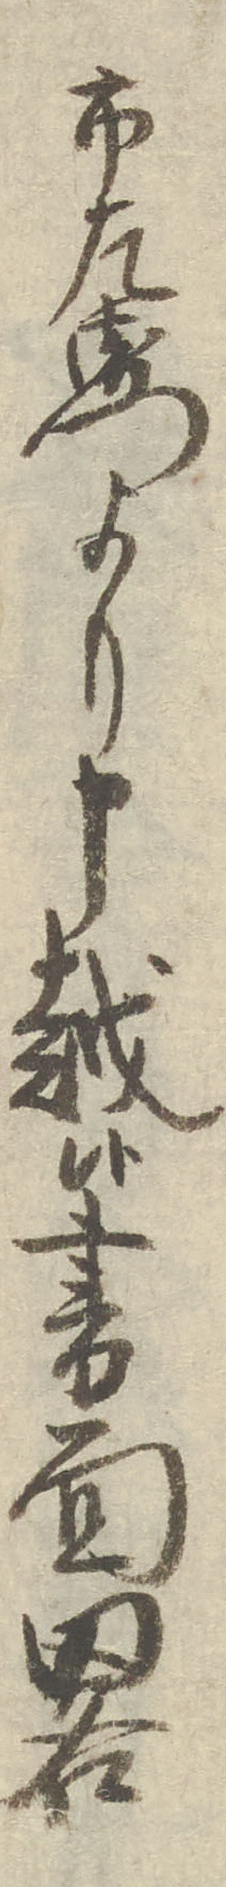市左衛門より申越候書面略
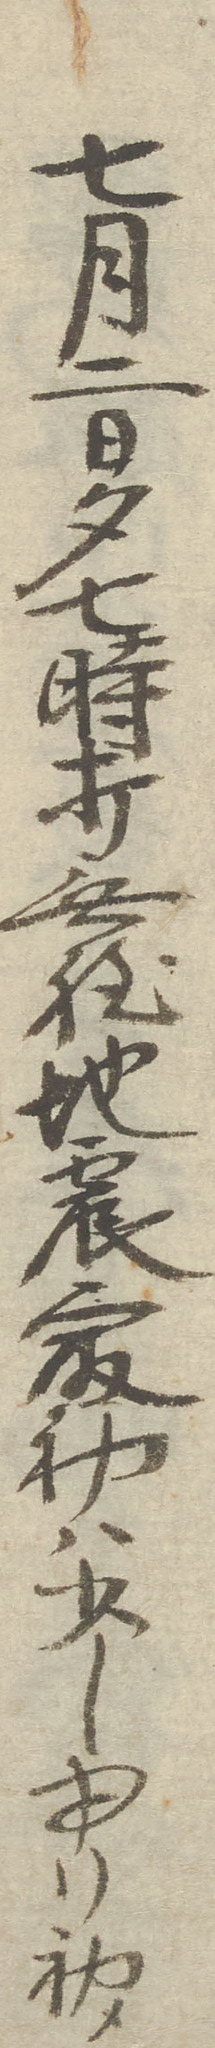一七月二日夕七時打無程地震最初ハ少しゆり初メ
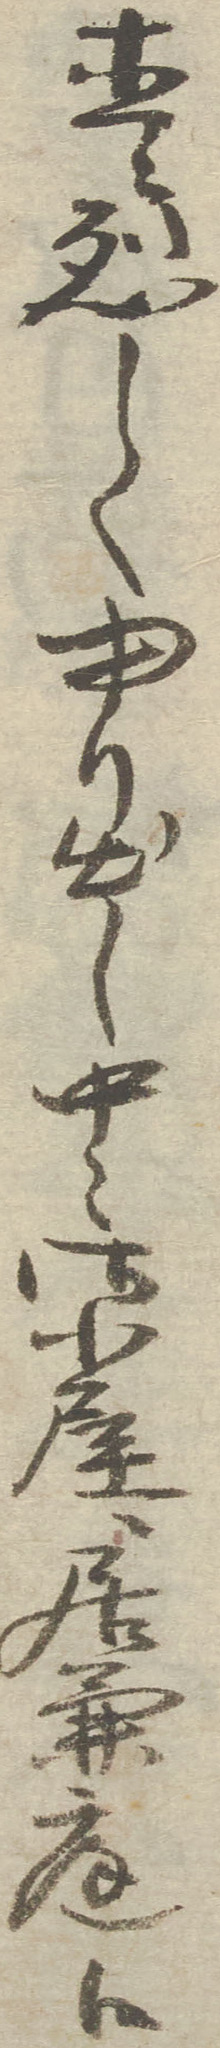直ニ烈しくゆり出し中々御小屋、居兼庭江
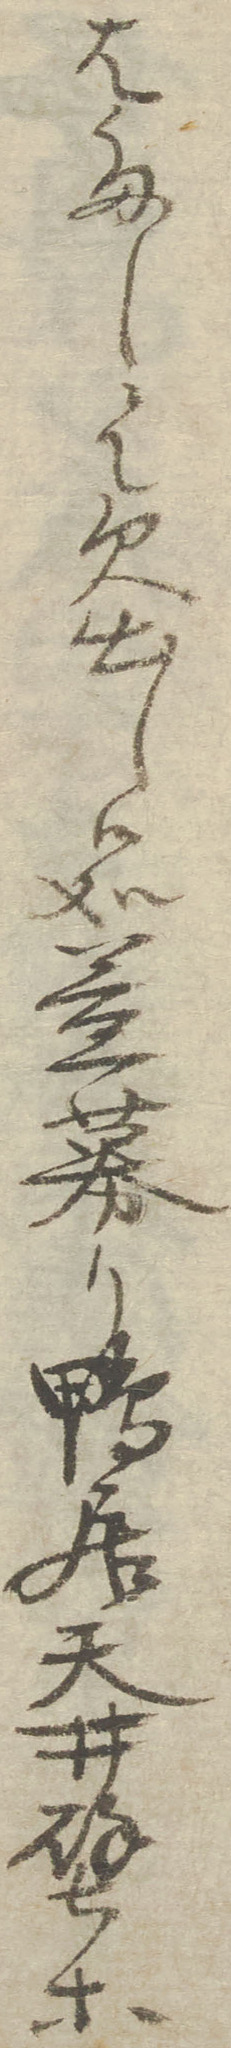はたしニて欠出し候処兼募り鴨居天井壁等
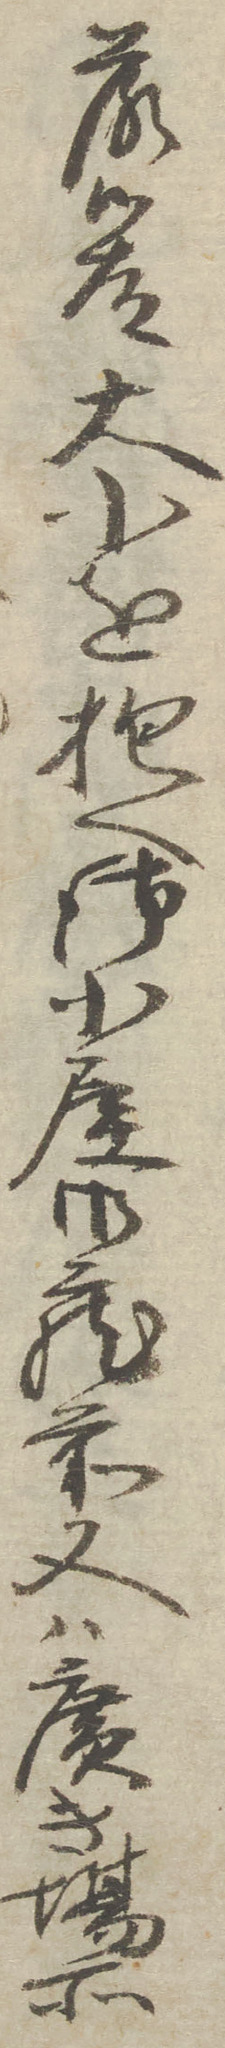落候故大小を抱へ御小屋御蔵前又ハ廣き場所
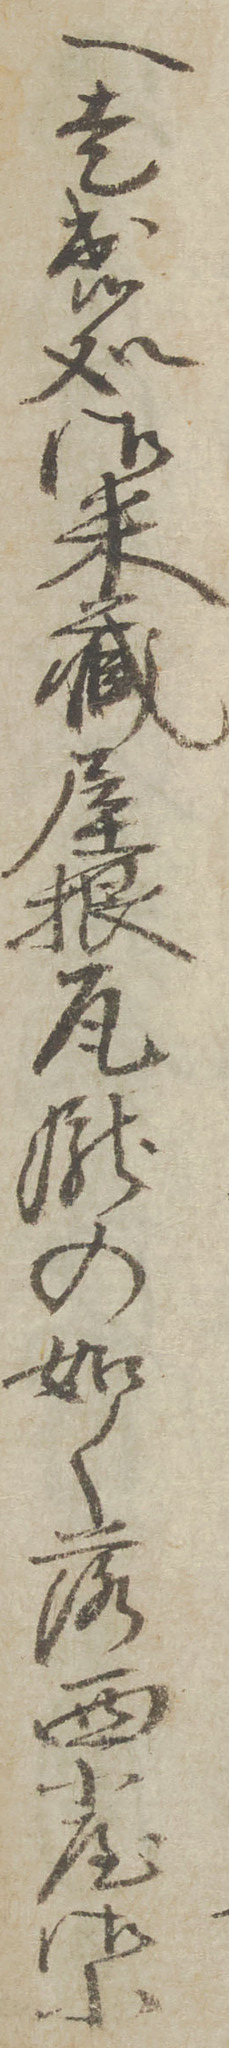へ走出候処御米蔵屋根瓦瀧の如く落西小屋御小
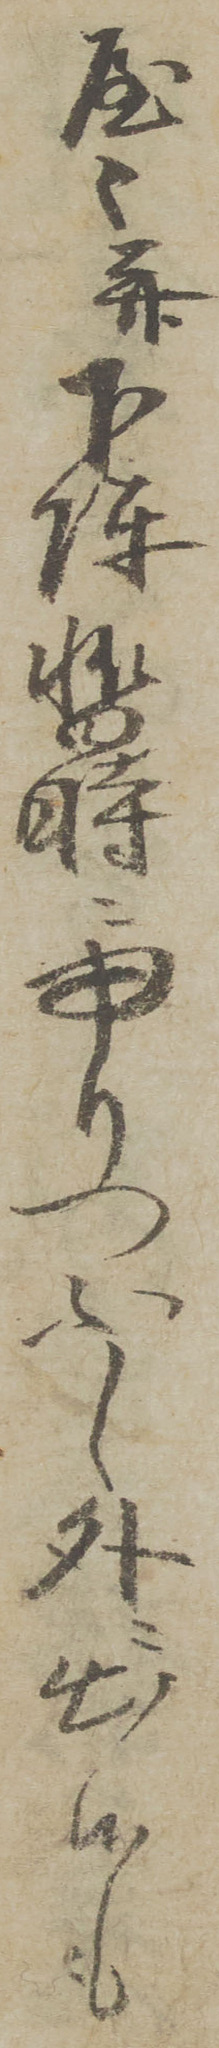屋々幷下暫時にゆりつふし外に出候も

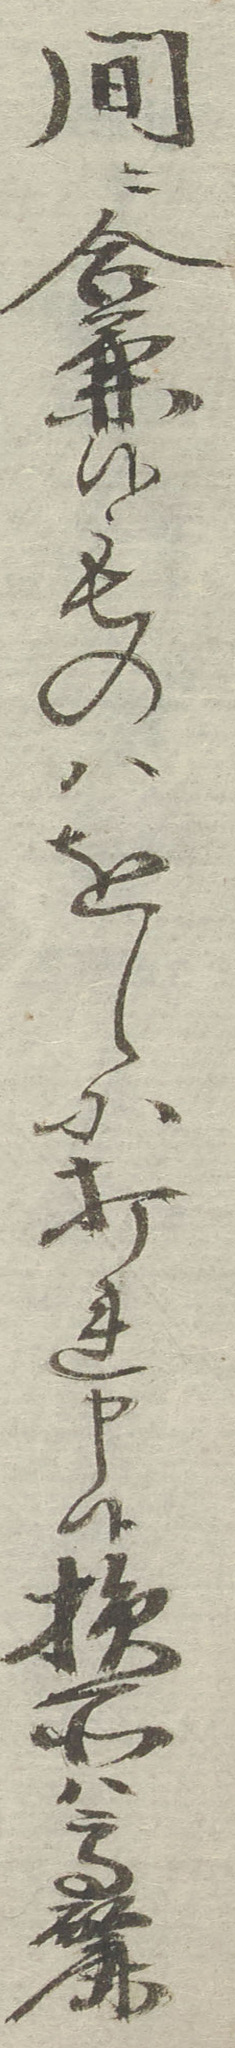間ニ合兼候ものハをしに打れ申候損所ハ高麗
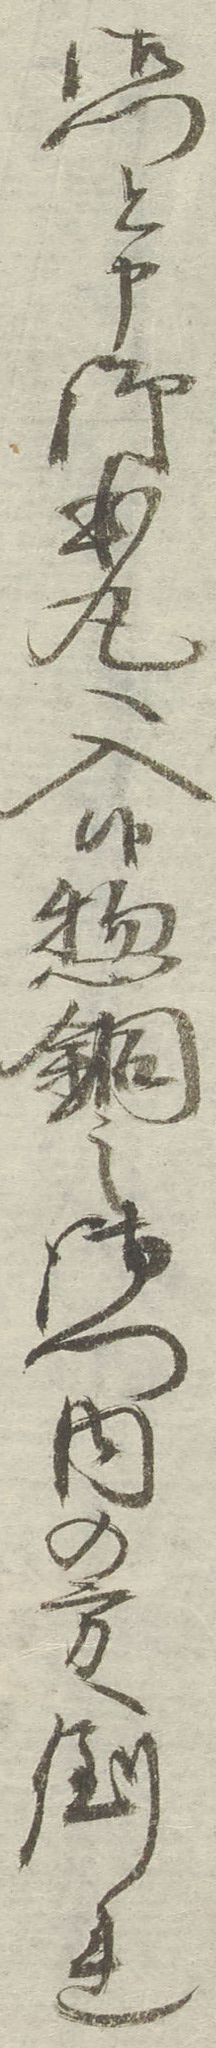御門と申御本丸へ入候惣銅之御門内の方へ倒れ
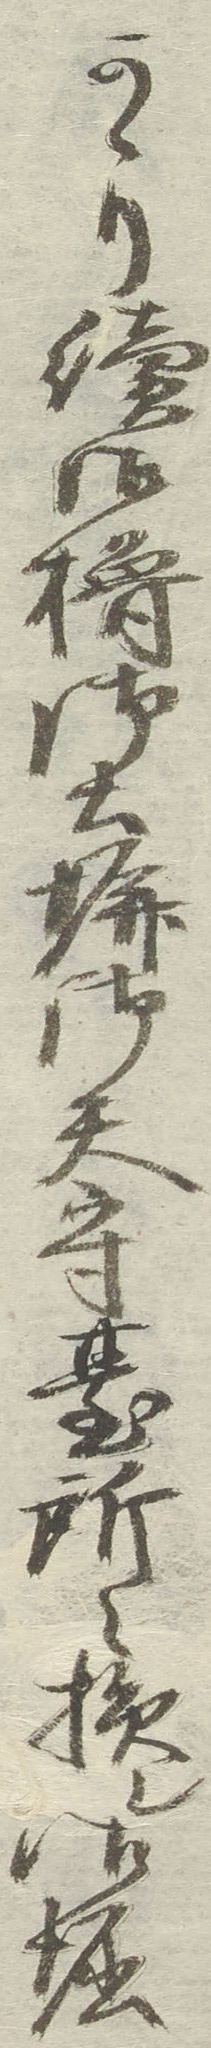かゝり續御櫓御土塀御天守臺所〻損シ御堀
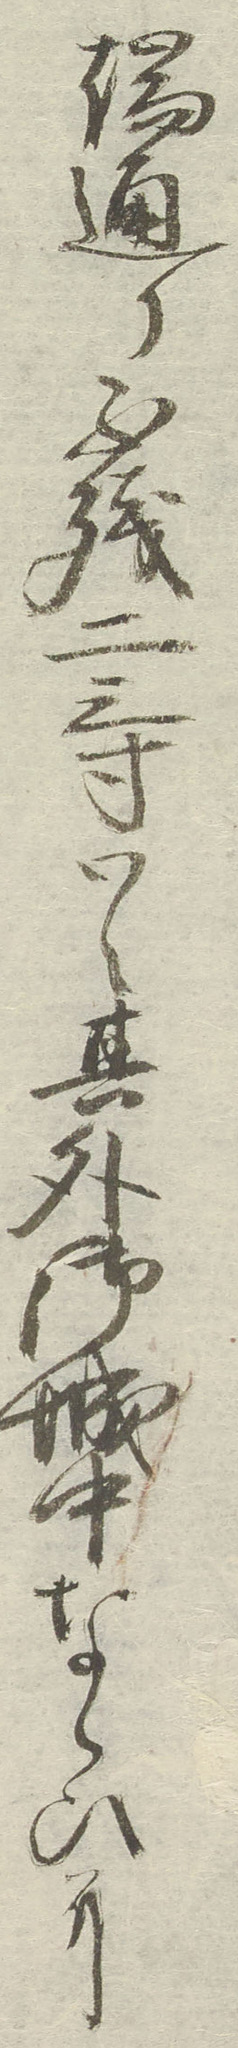端通り不残二三寸ツヽ其外御城中ならひに
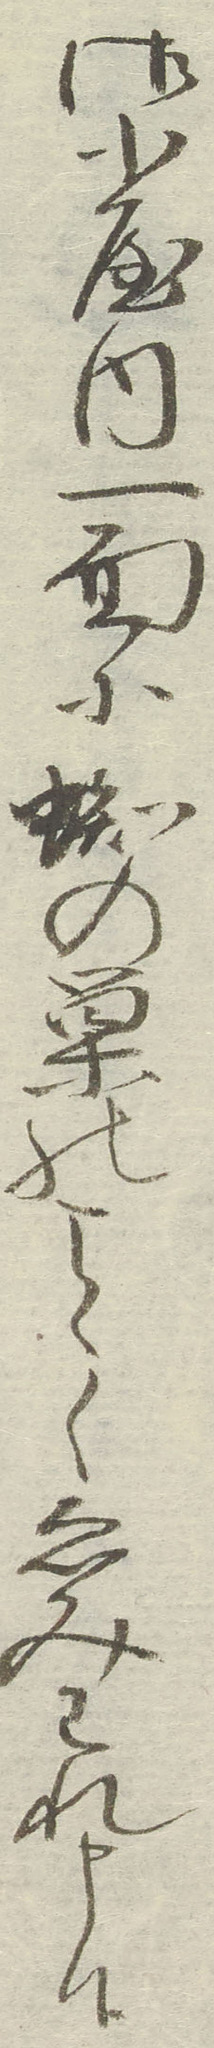御小屋内一面に蜘の巣のことくゑみわれ申候
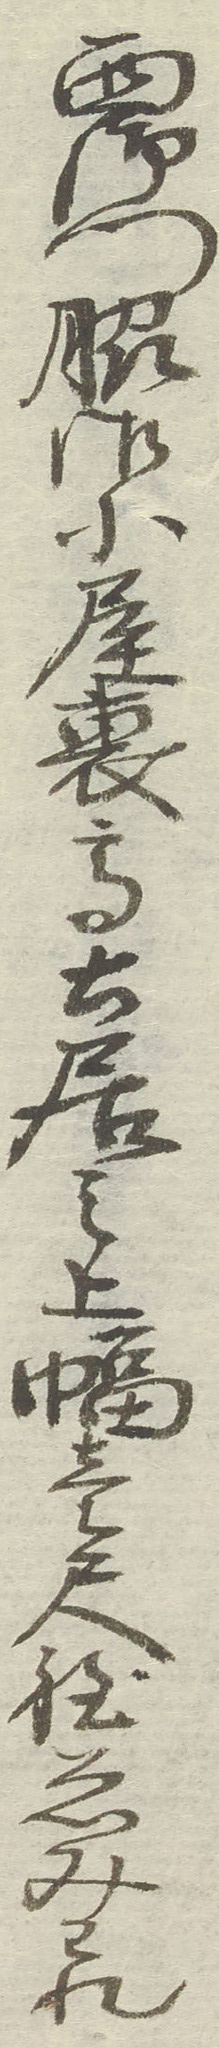西御門脇御小屋裏高土居之上幅壱尺程ゑみわれ
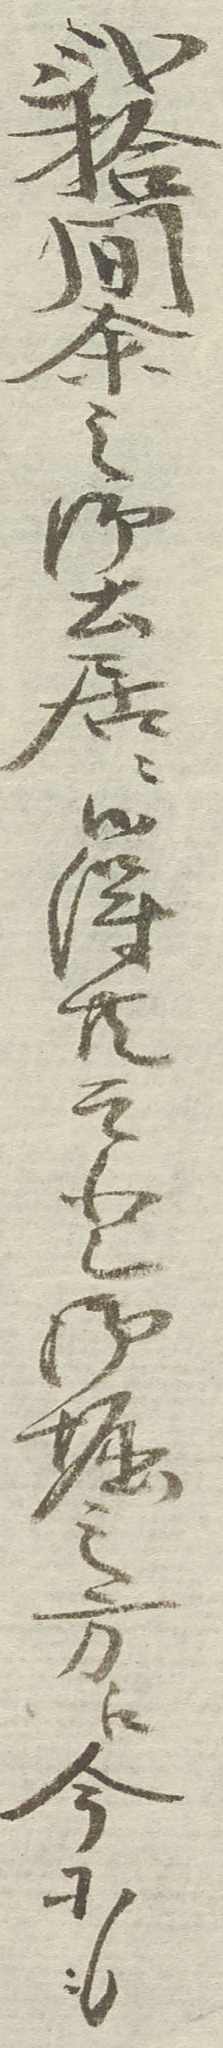弐拾間余之御土居ニ候得共そと御堀之方江今にも
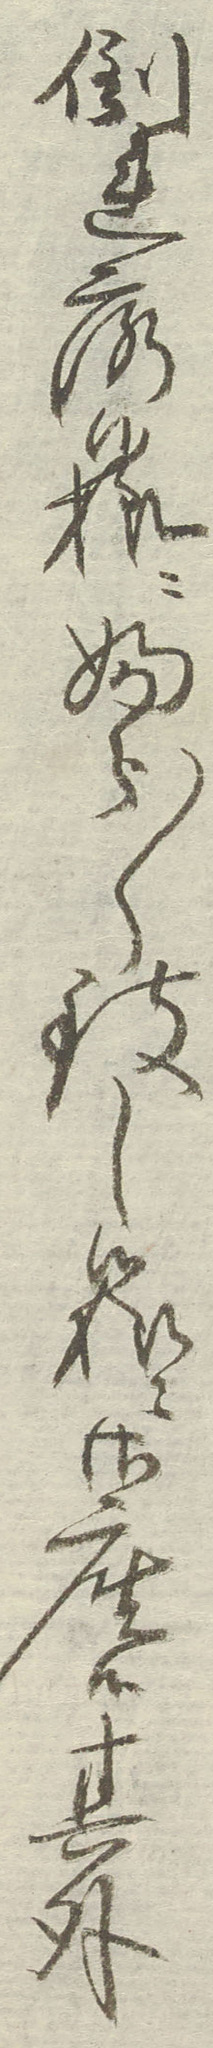倒れ落候様ニふら〳〵致し候様ニ御座候其外
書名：[七月二日京都大地震に付御番衆大木市左衛門より申し越し候書面畧書状写]
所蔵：東京大学総合図書館 General Library in the University of Tokyo, JAPAN
